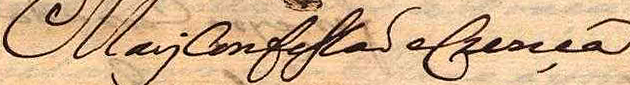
Mais Confissaõ e Crença
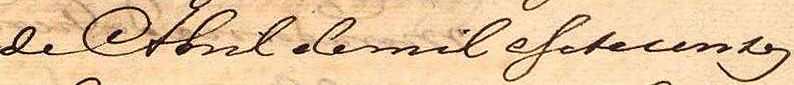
de Abril de mil e setecentos
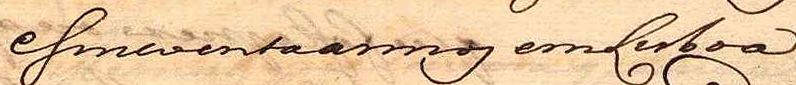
e sincoenta annos em Lisboa
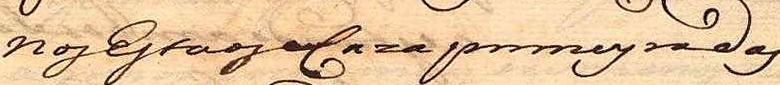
nos Estaoz e Caza primeyra das
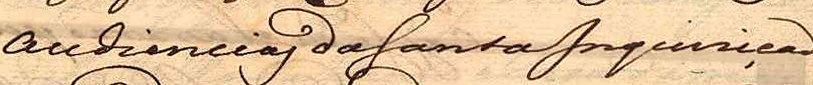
audiencias da santa Jnquiziçaõ
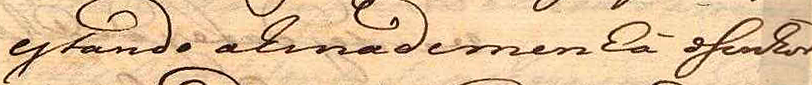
estando ahi na de menhã o senhor
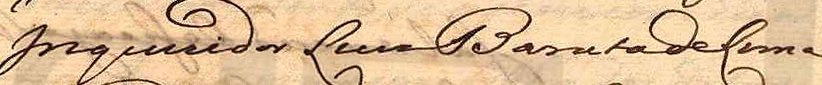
Jnquizidor Luiz Barata de Lima
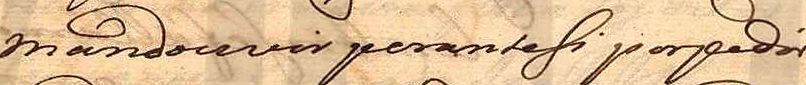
mandou vir perante si por pedir
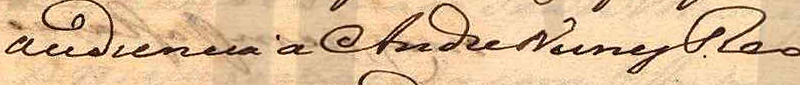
audiencia à Andre Nunes Reo
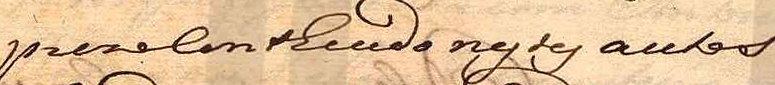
prezo contheudo nestes autos
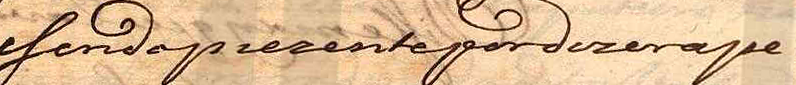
e sendo prezente por dizer a pe
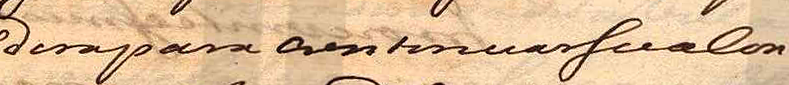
dira para continuar sua Con
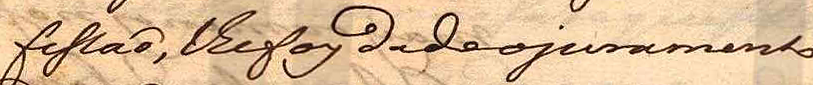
fissaõ, lhe foy dado o juramento
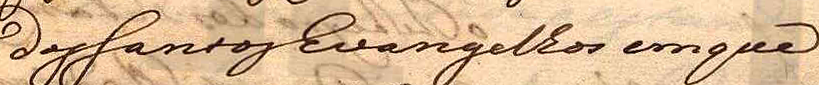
dos santos Evangelhos em que
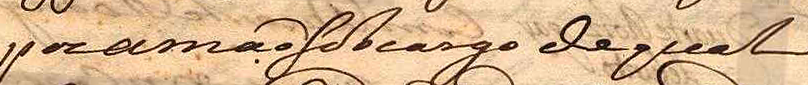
poz a maõ sob cargo do qual
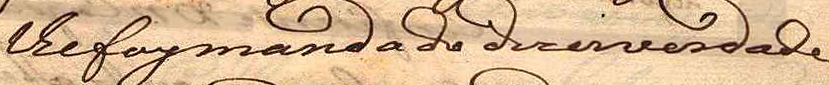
lhe foy mandado dizer verdade
